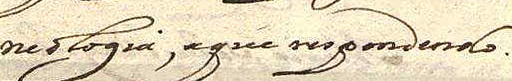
neologia, a que respondendo.
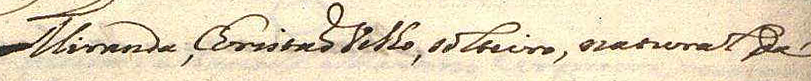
Miranda, Christaõ Velho, solteiro, natural da
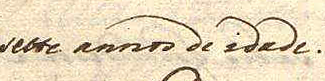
sette annos de idade.
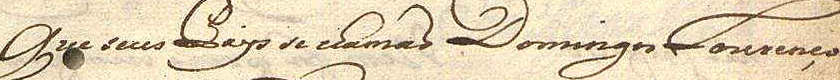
Que seus Pays se chamaõ Domingos Lourenço
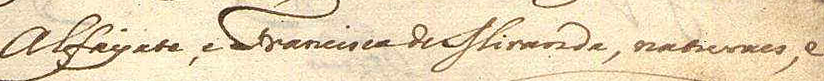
Alfayate, e Francisca de Miranda, naturaes, e
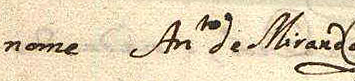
nome Anto de Miranda
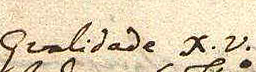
Qualidade x. v.
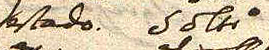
estado. Soltro
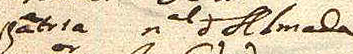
pâtria nal d̄ Almada
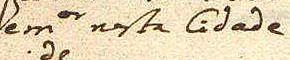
e mor nesta Cidade
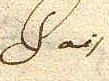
Pais
